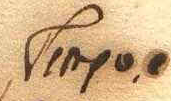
Tempo, e
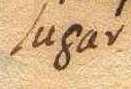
lugar
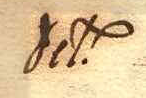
del̄.o
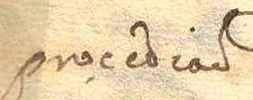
proçediaõ
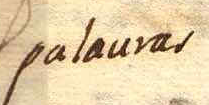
palauras
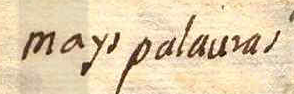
mays palauras
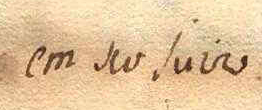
em seo Iuizo
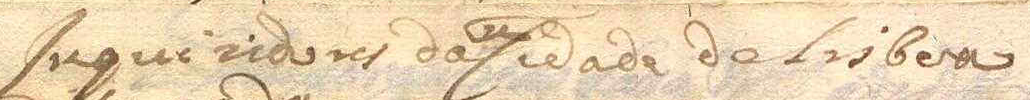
Jnquizidores da Cidade de Lisboa
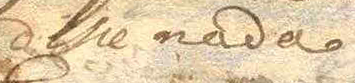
disse nada
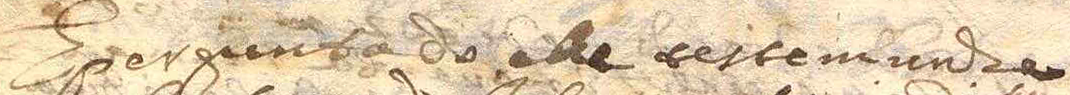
E perguntado elle testemunha
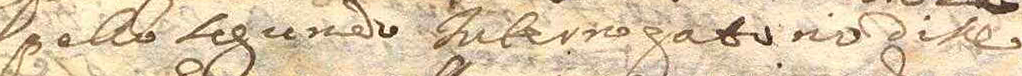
pello segundo Interrogatorio disse
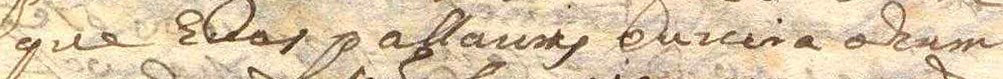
que huas pallauras ouuira a hum
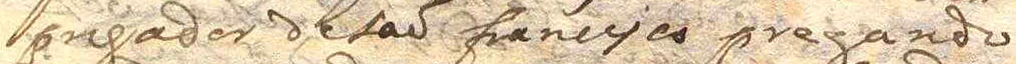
pregador de saõ francisco pregando
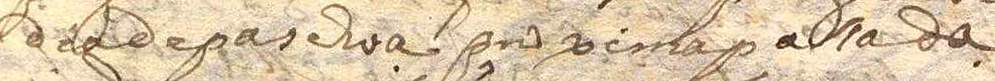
dia de paschoa proxima passada
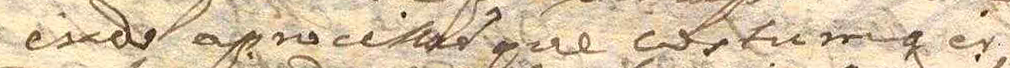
indo a procissaõ que costuma ser
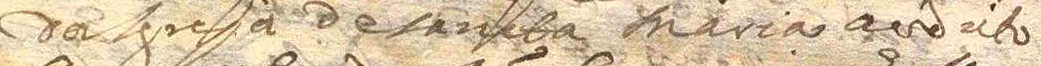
da Igreja de sancta Maria ao dicto
